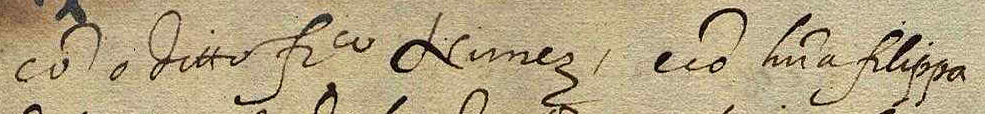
cō o ditto frco Nunez , e cō hūa filippa
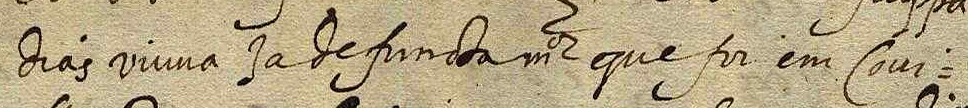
dias viuua Ja defuncta mor que foi em Coui
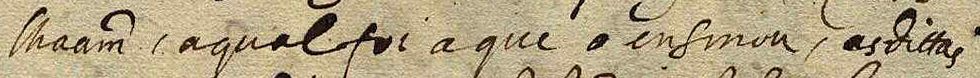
lhaam , a qual foi a que o ensinou, as dittas
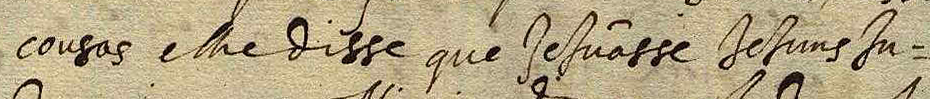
cousas e lhe disse que JeJuāsse Jejuns Ju
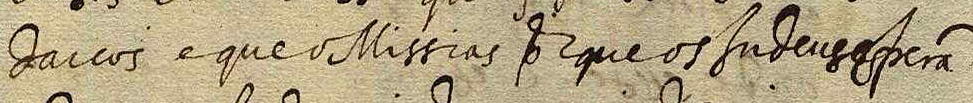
daicos e que o Missias por que os Judeus esperā
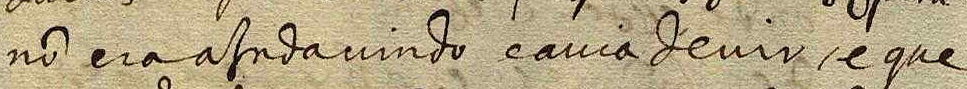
nō era aJnda uindo e auia de uir , e que
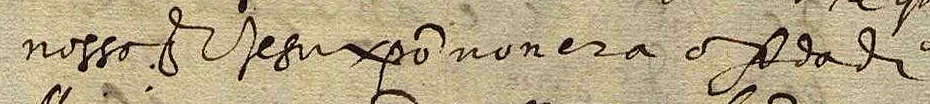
nosso sor Jesu xpō non era o ꝟdadro
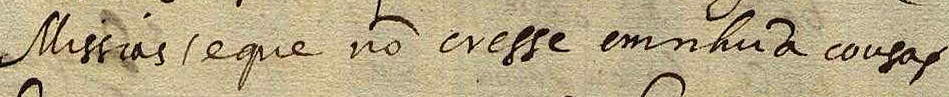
Missias , e que nō cresse em nhūa cousas
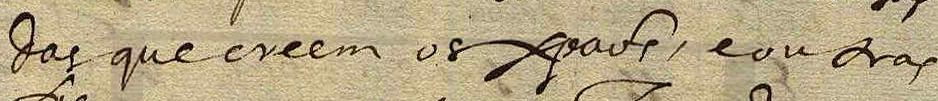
das que creem os xpaõs, e outras
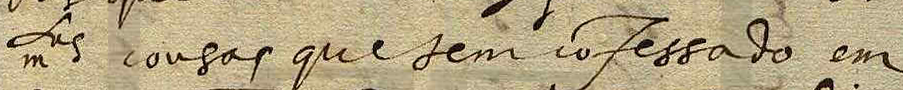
mtas cousas que tem cōfessado em
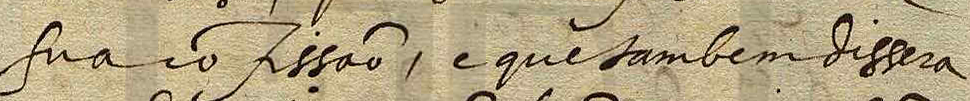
sua cōfissão , e que tambem dissera
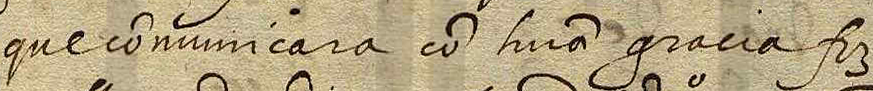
que cōmunicara cō huā gracia frz
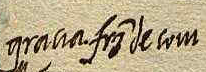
gracia frz̄ de coui
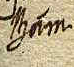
lham
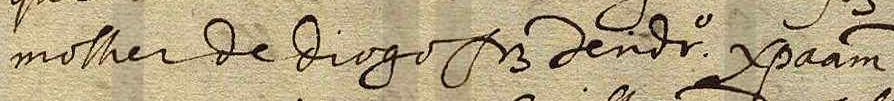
molher de diogo frz̄ tendro xpaam̄
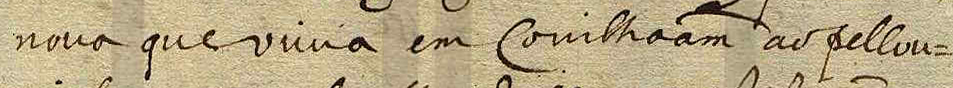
noua que viuia em Couilhaām ao pellou
